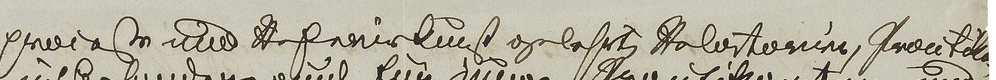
proceß- und Referirkunst gelehrt, Relatorien, Practika,
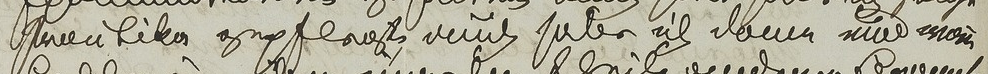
Practika gepflegt, auch habe ich dann und wann
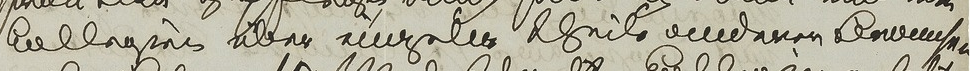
Collegien über einzelne Theile anderer Branchen
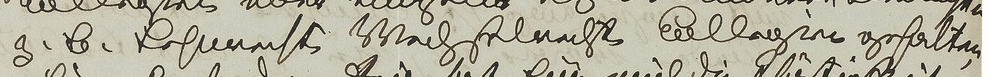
z. B. Lehnrecht, Wechselrecht, Collegien gehalten.
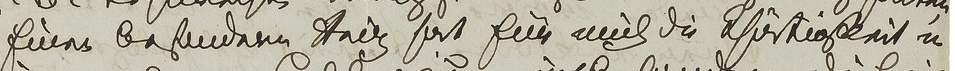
Einen besondern Reiz hat für mich die Thätigkeit in
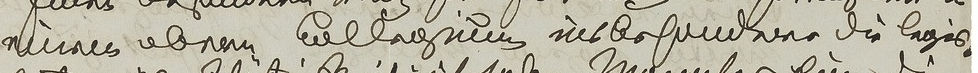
einem obern Collegium, insbesondere die legis-
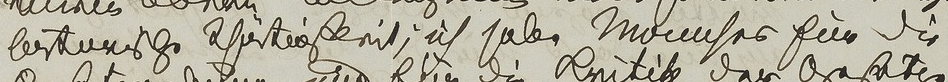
latorische Thätigkeit; ich habe Manches für die
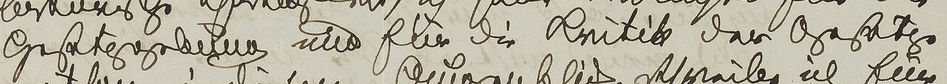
Gesetzgebung und für die Kritik der Gesetze
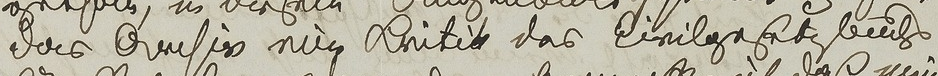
das Archiv eine Kritik des Civilgesetzbuchs
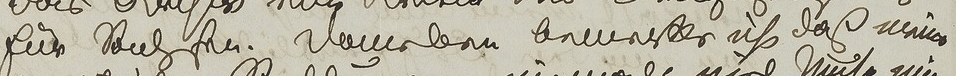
für Sachsen. Daneben bemerke ich, daß meine
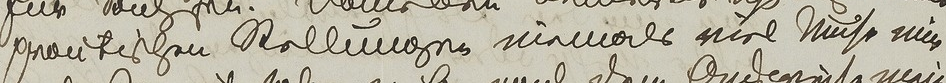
practischen Stellungen niemals viel Muse mir
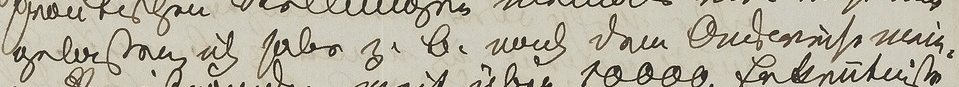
gelaßen, ich habe z. B. nach dem Ausweise mein-
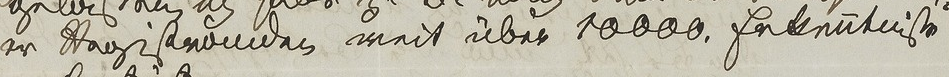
er Registranden weit über 10000. Erkenntniße
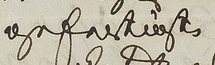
gefertigt. –
